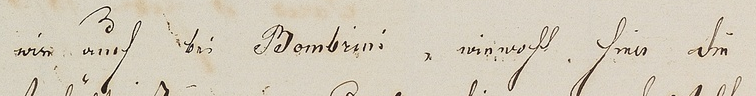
wir auch bei Bombrini, wiewohl hier die
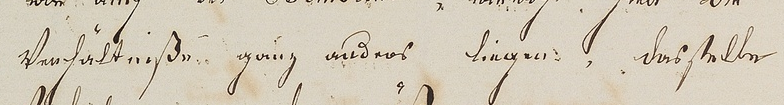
Verhältniße ganz anders liegen, dasselbe
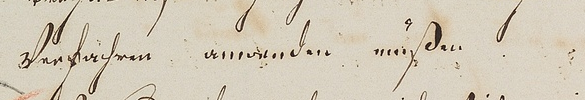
Verfahren anwenden müßen.
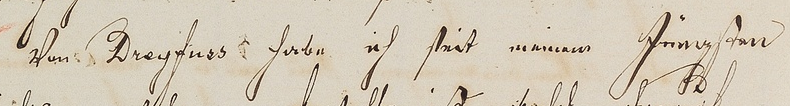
Von Dreyfuss habe ich seit meinem Jüngsten
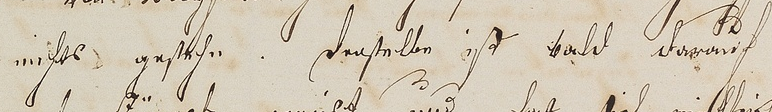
nichts gesehen. Derselbe ist bald darauf
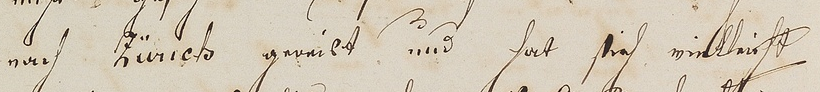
nach Zürich gereist und hat sich vielleicht
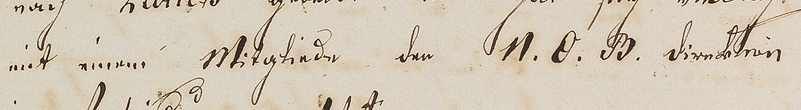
mit einem Mitgliede der N.O.B. Direktion
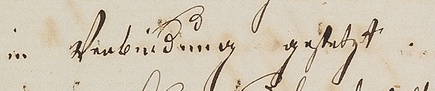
in Verbindung gesetzt.
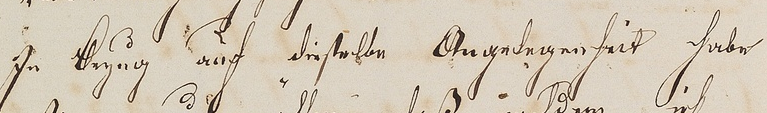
In Bezug auf dieselbe Angelegenehit habe
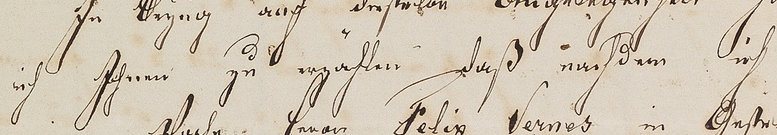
ich Ihnen zu erzählen daß nachdem ich
